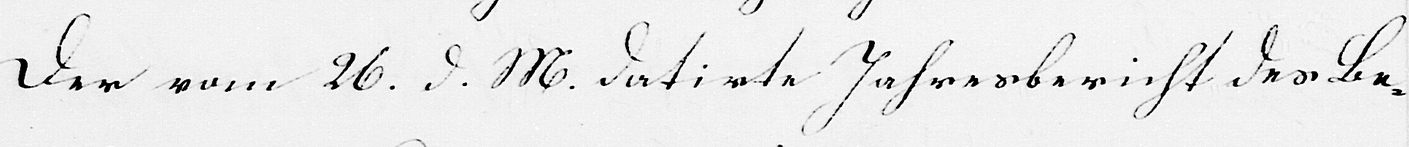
Der vom 26. d. M. datirte Jahresbericht des Be¬
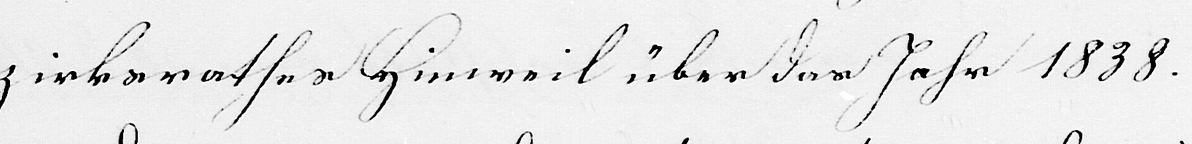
zirksrathes Hinweil über das Jahr 1838.
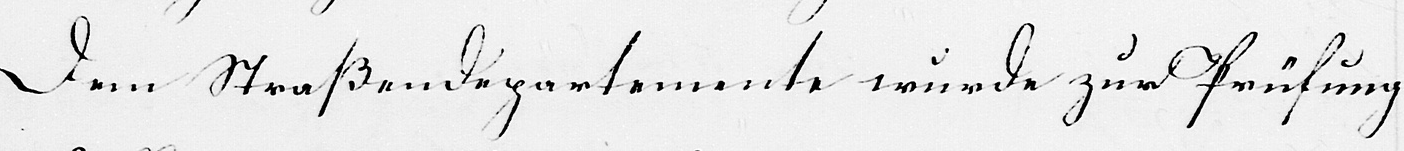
Dem Straßendepartemente wurde zur Prüfung
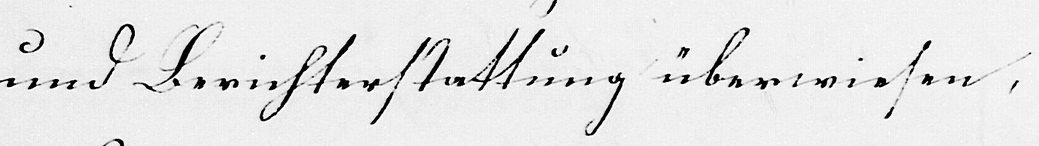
und Berichterstattung überwiesen,
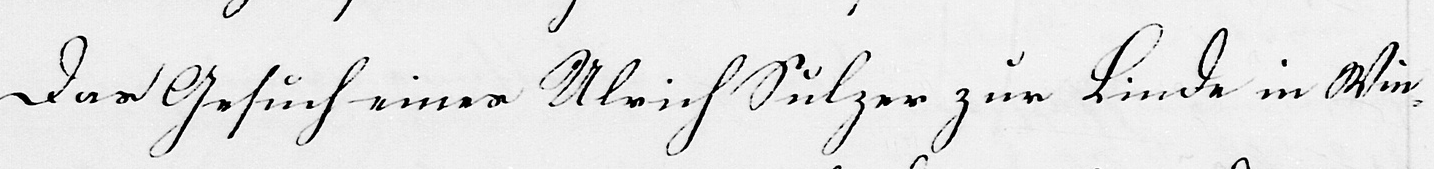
Das Gesuch eines Ulrich Sulzer zur Linde in Win¬
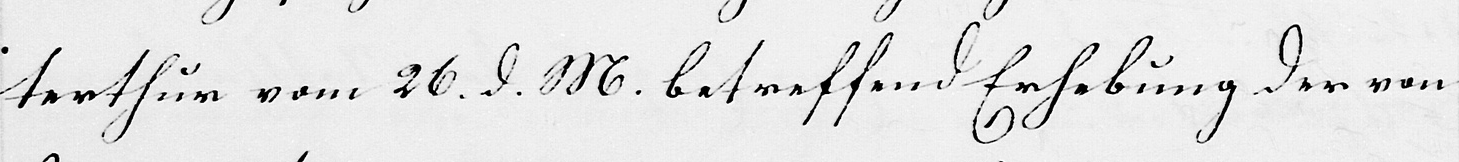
terthur vom 26. d. M. betreffend Erhebung der von
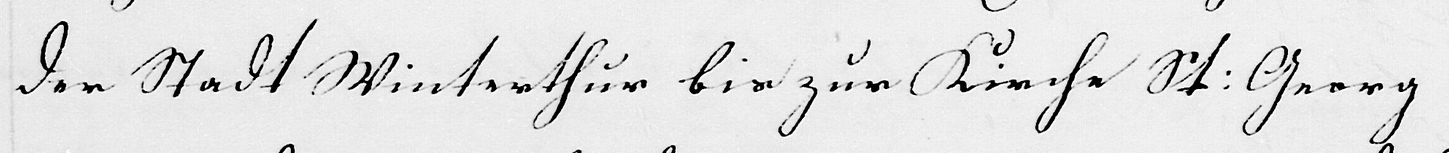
der Stadt Winterthur bis zur Kirche St: Georg
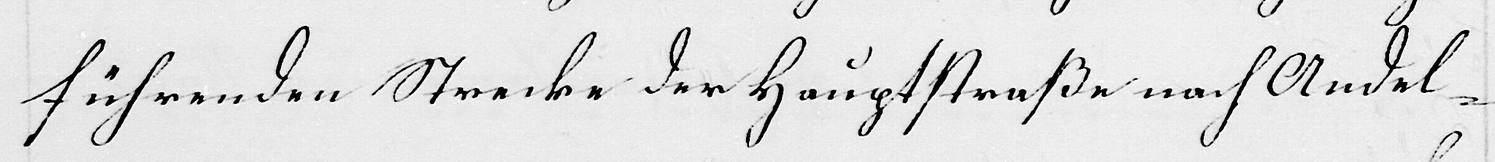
führenden Strecke der Hauptstraße nach Andel-
